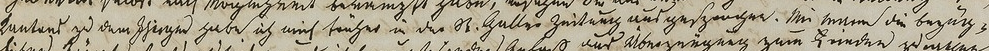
Kantons zu dem Ihrigen habe ich mich früher in der St. Galler Zeitung ausgesprochen. Mir waren die bezüg-
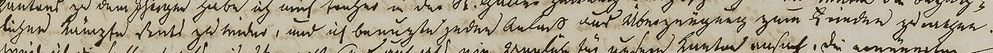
lichen Kämpfe stets zuwider,und ich benuzte jeden Anlaß aus Überzeugung zum Frieden zu rathen.
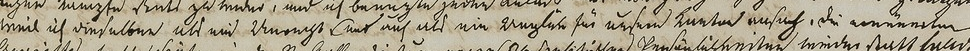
Weil ich dieselben als ein Unrecht (und auch als ein Unglük für unsern Kanton ansah), die erneuerten
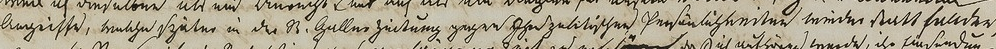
Angriffe, welche später in der St. Galler Zeitung gegen Ihre politischen Persönlichkeiten wieder statt fanden,
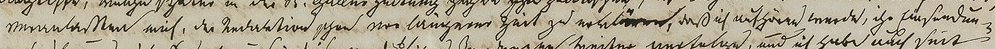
veranlaßten mich, der Redaktion schon vor längerer Zeit zu erklären, daß ich aufhören werde, ihr Einsendun-
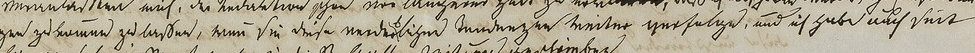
gen zukommen zu laßen, wenn Sie diese verderblichen Tendenzen weiter verfolge, und ich habe auch seit
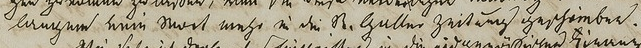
langem kein Wort mehr in die St. Galler Zeitung geschrieben.
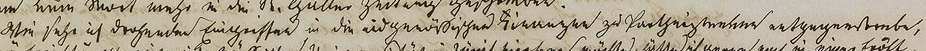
Wie sehr ich drohenden Eingriffen in die eidgenößischen Finanzen zu Partheizweken entgegenstrebe,
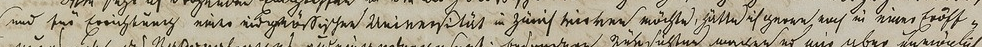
(und für Errichtung einer eidgenößischen Universität in Zürich wirken möchte), hätte ich gerne noch in einer Eröff-
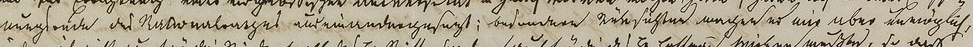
nungsrede des Nationalrathes auseinandergesezt; besondere Rüksichten machen es mir aber unmöglich,
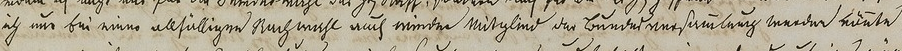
ich nur bei einer allfälligen Nachwahl auch wieder Mitglied der Bundesversammlung werden könnte.
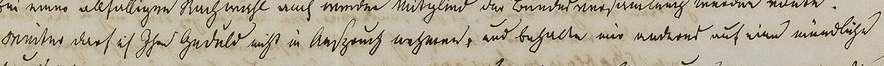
Weiter darf ich Ihre Geduld nicht in Anspruch nehmen, und behalte mir anderes auf eine mündliche
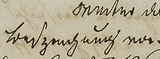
Besprechung vor.
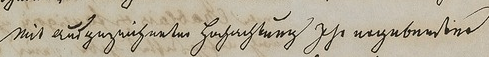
Mit ausgezeichneter Hochachtung Ihr ergebenster
